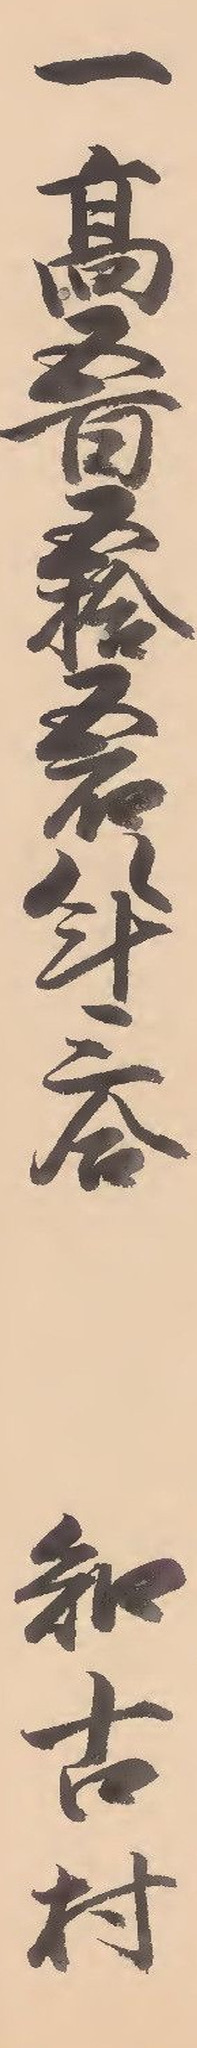一高五百五拾五石八斗三合知古村
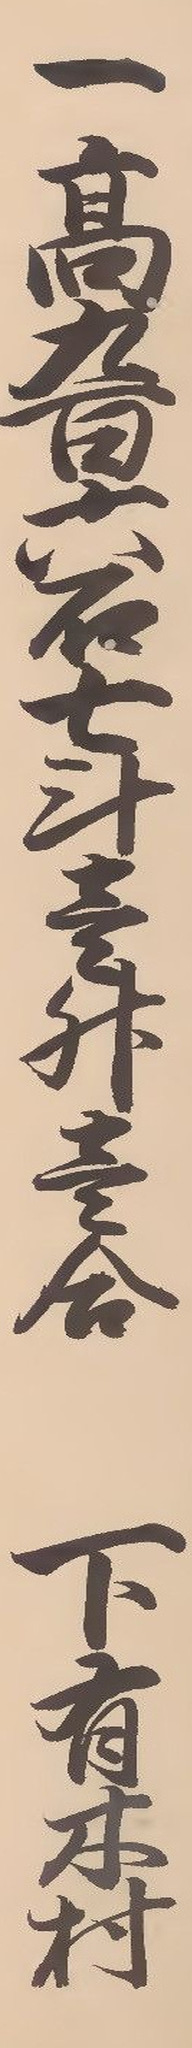一高九百六石七斗壱升壱合下有木村
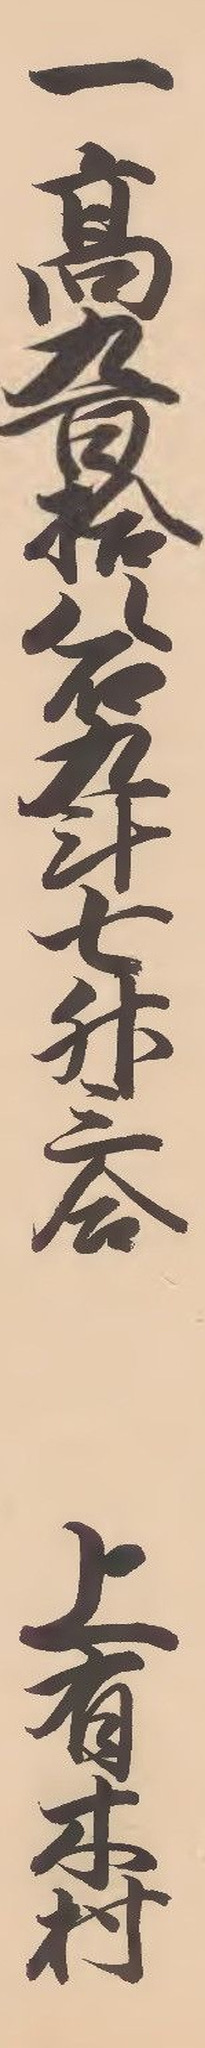一高九百拾八石九斗七升三合上有木村
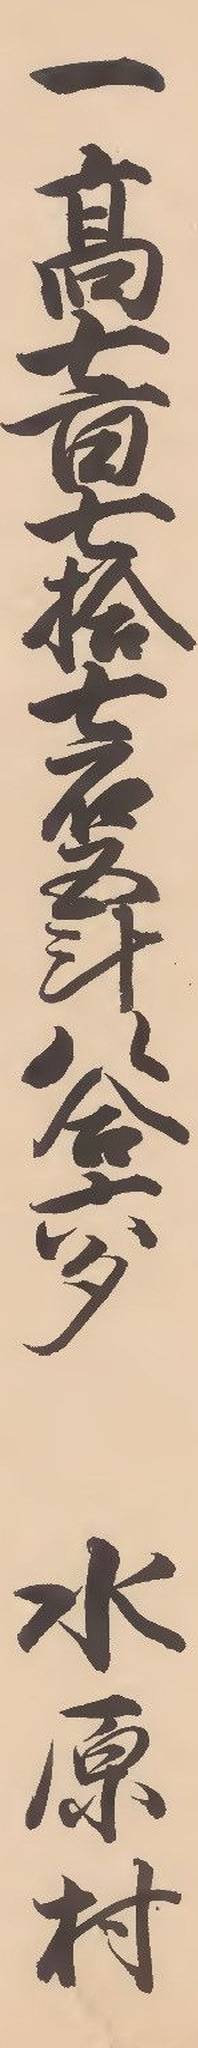一高七百七拾七石五斗八合六勺水原村
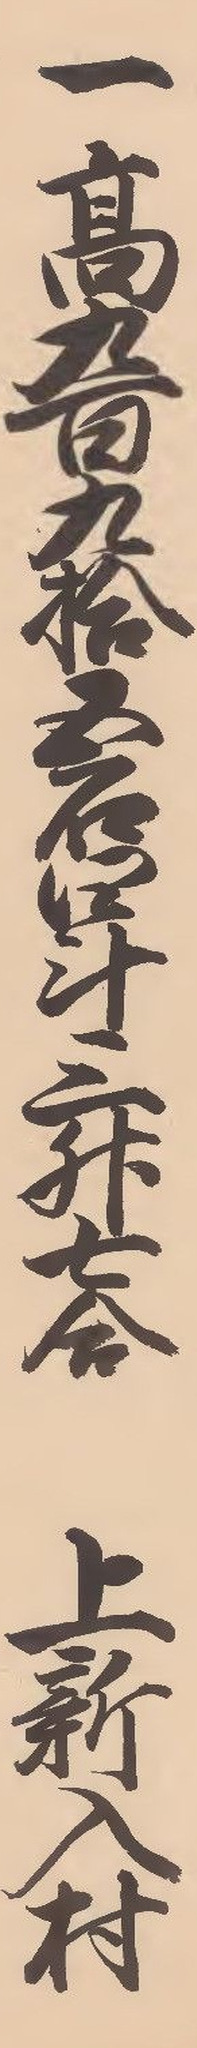一高九百九拾五石四斗三升七合上新入村

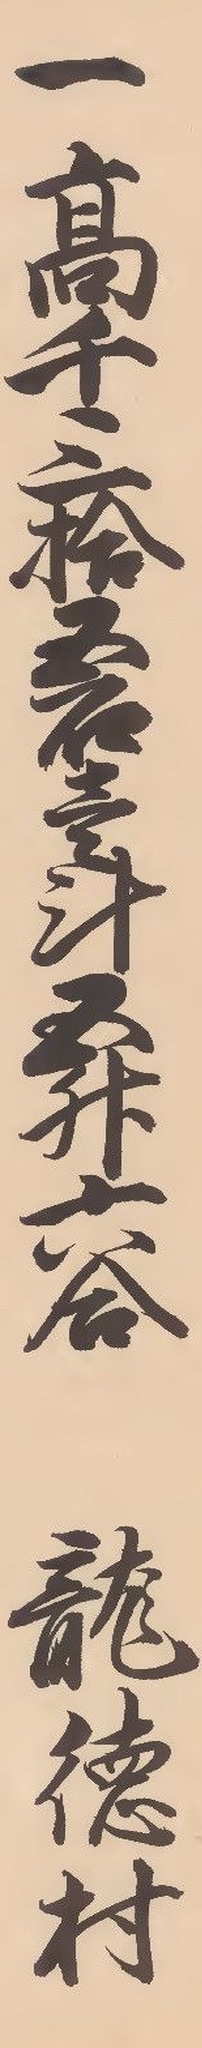一高千三拾五石壱斗五升六合竜徳村
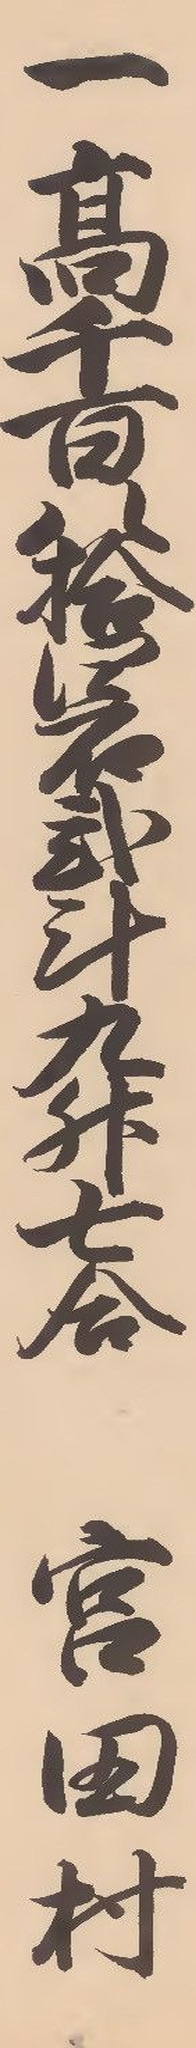一高千百八拾四石弐斗九升七合宮田村
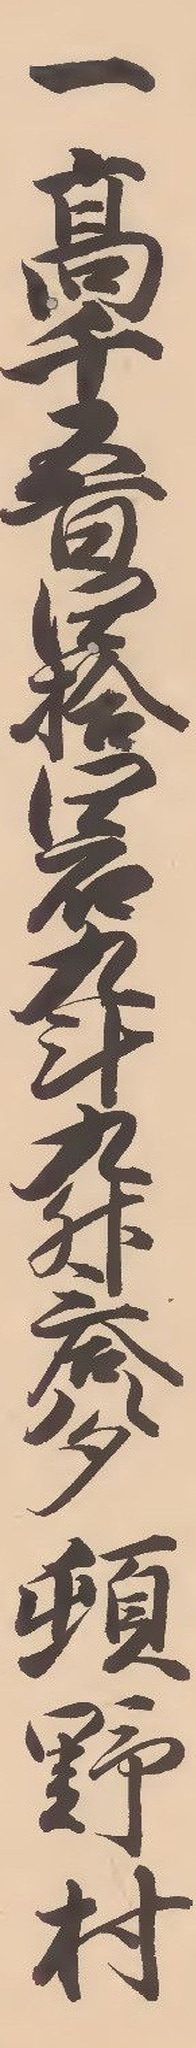一高千五百四拾四石九斗九升三合八勺頓野村
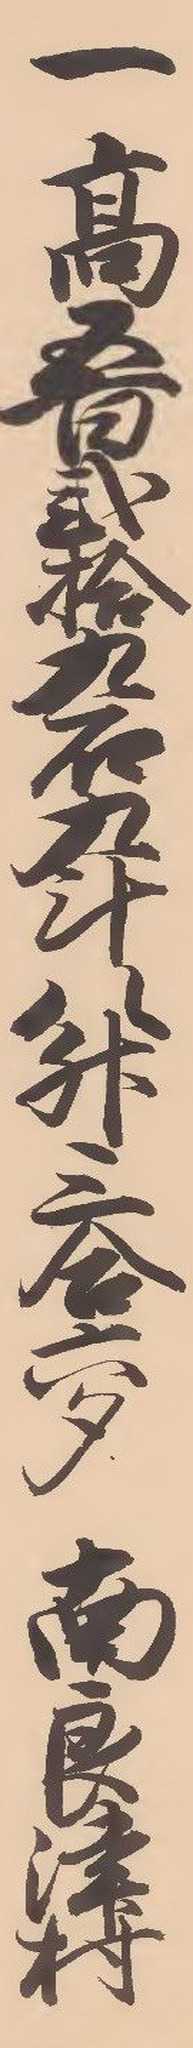一高五百弐拾九石九斗八升三合六勺南良津村
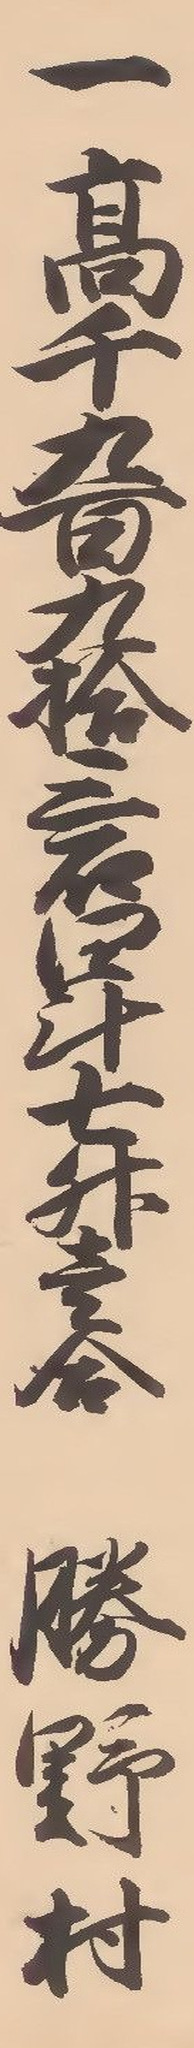一高千九百九拾三石四斗七升壱合勝野村

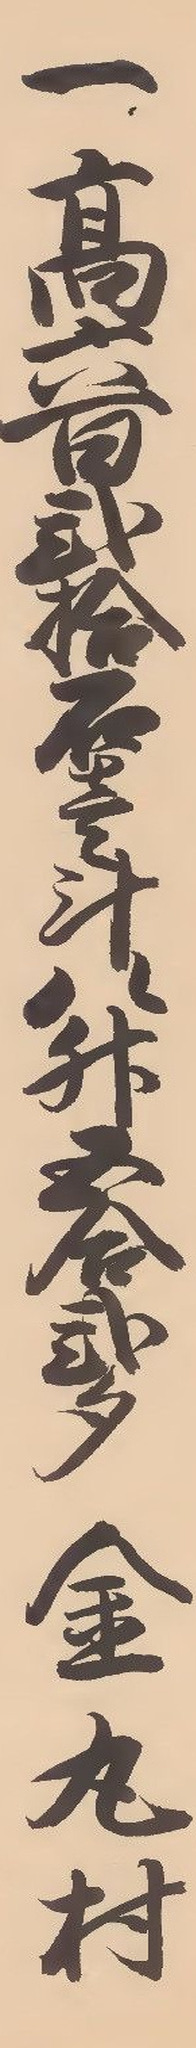一高六百弐拾石壱斗八升五合弐勺金丸村
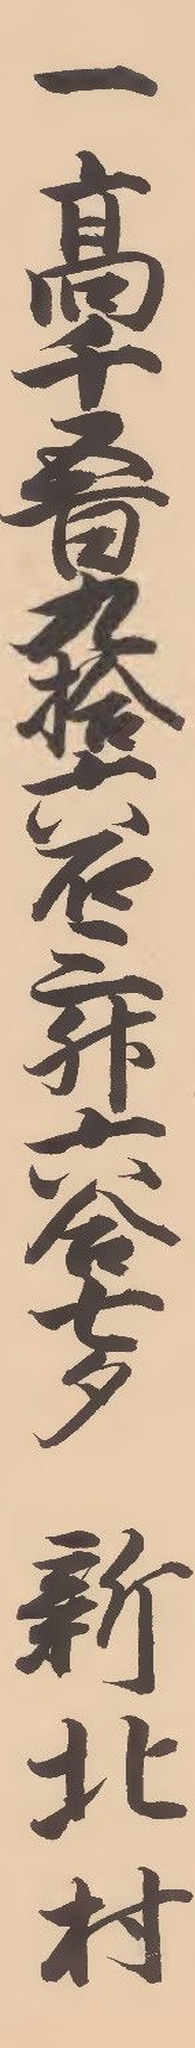一高千五百九拾六石三升六合七勺新北村
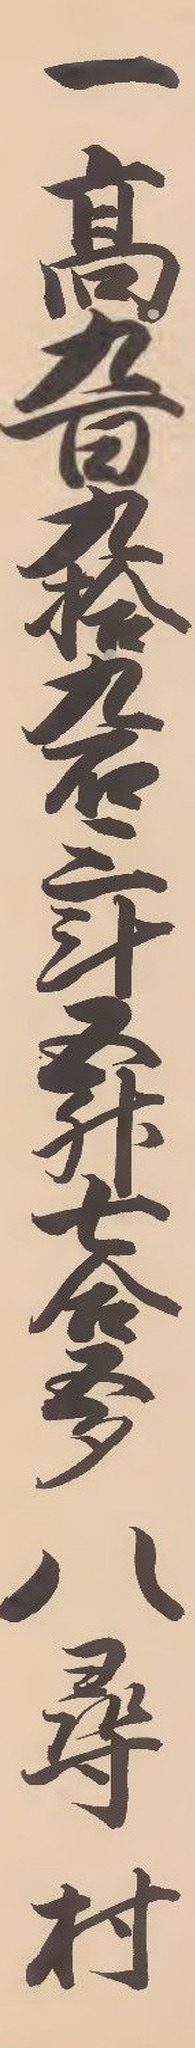一高九百九拾九石三斗五升七合五勺八尋村
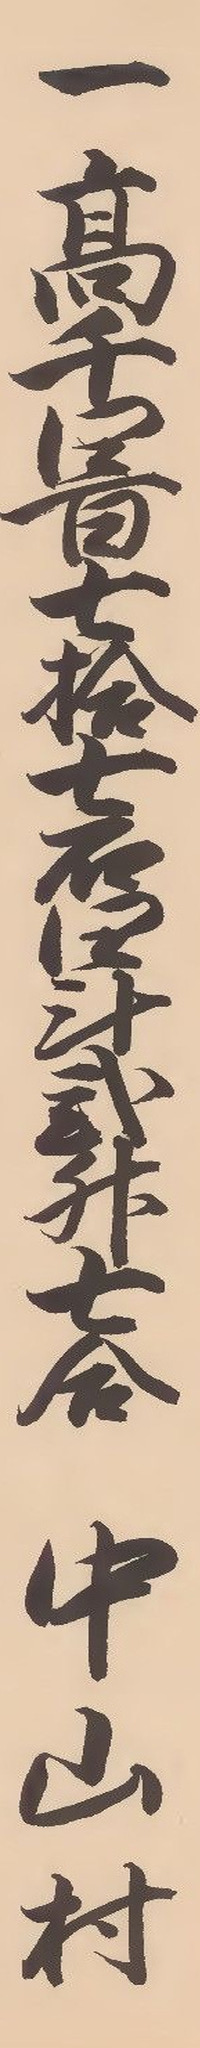一高千四百七拾七石四斗弐升七合中山村
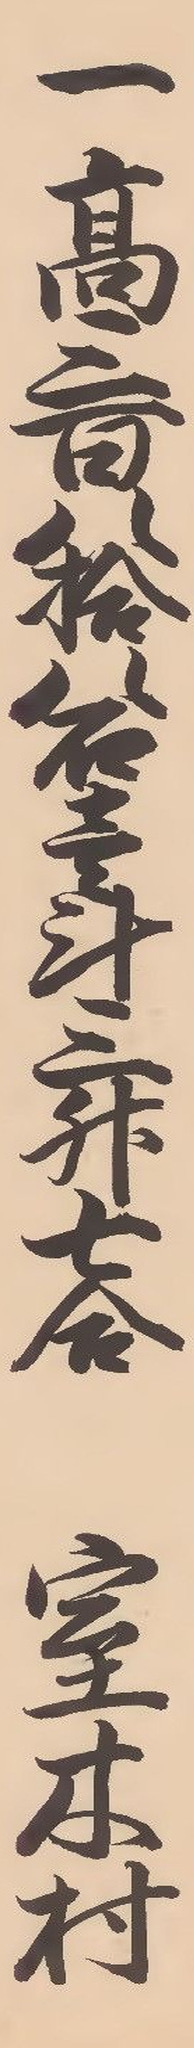一高三百八拾八石壱斗三升七合室木村
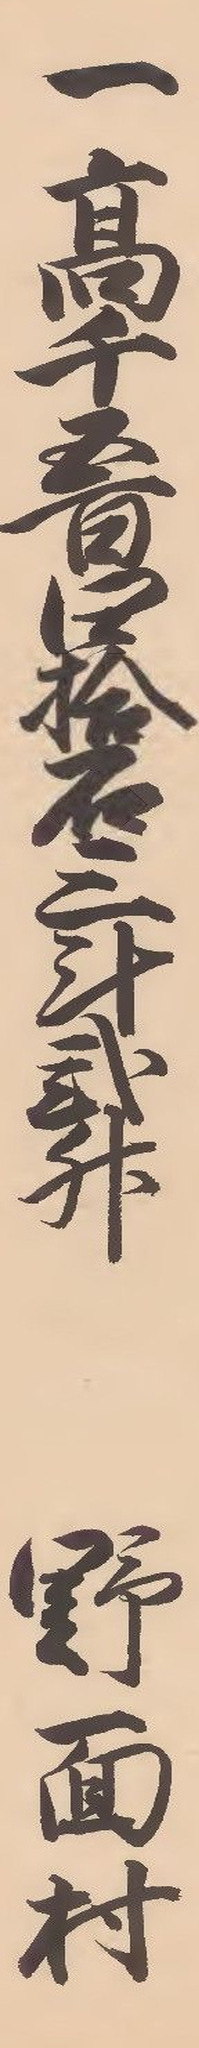一高千五百四拾石三斗弐升野面村
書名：筑前国郷帳
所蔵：国立公文書館 National Archives of Japan
